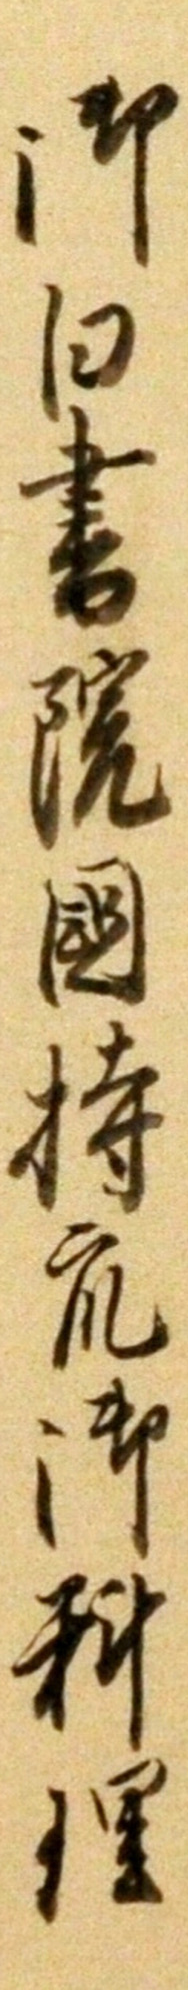御白書院国持衆御料理
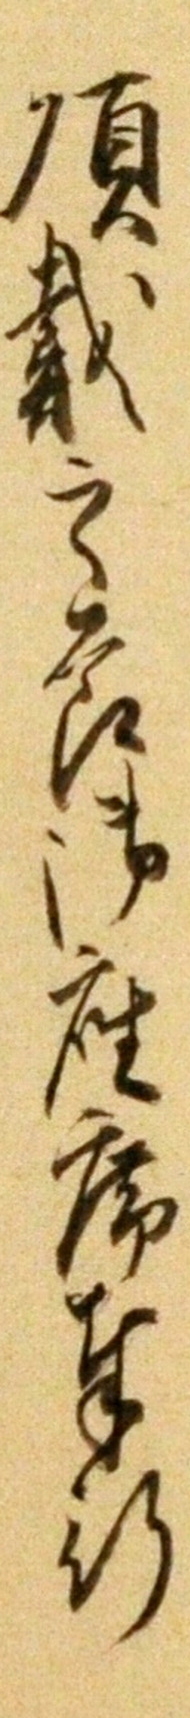頂戴之節、御座席奉行
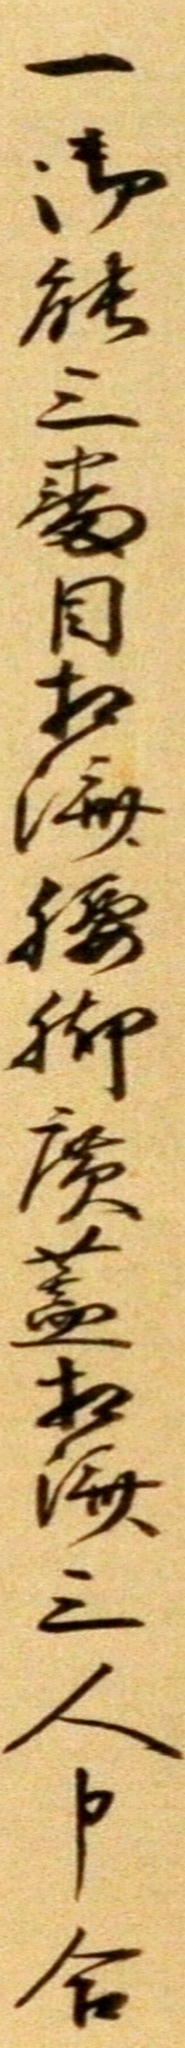一御能三番目相済、腰脚廣蓋相済、三人申合
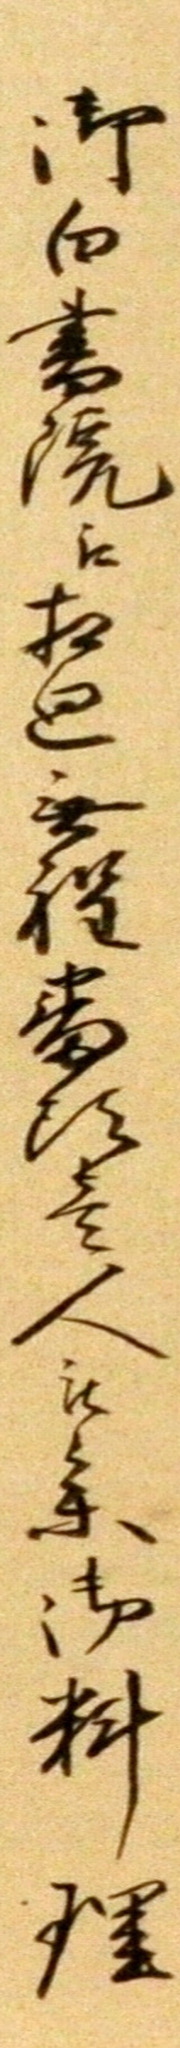御白書院江相廻、無程番頭壱人被参、御料理
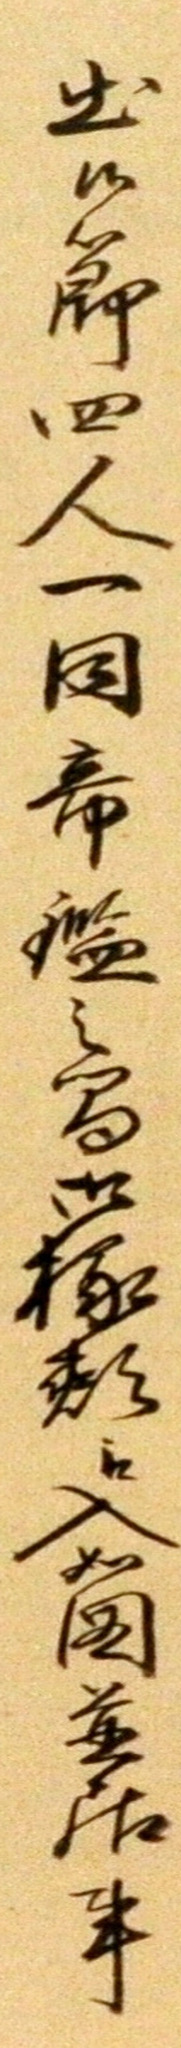出候節、四人一同定鑑之間御掾顔江入如図並居事、
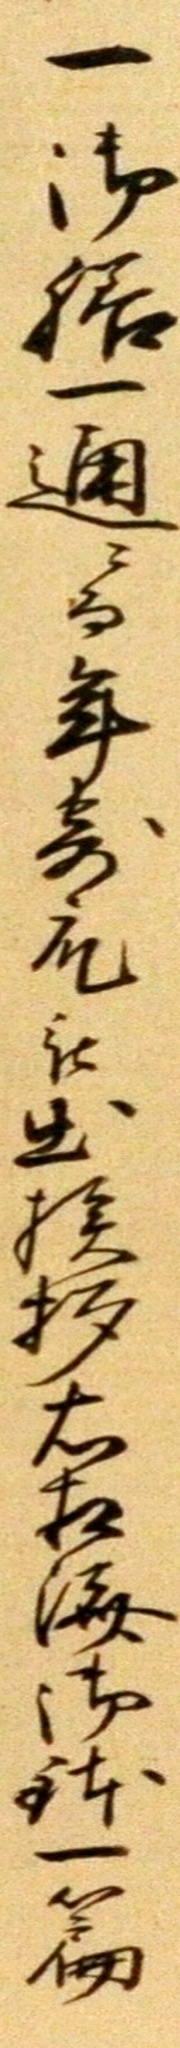一御膳一通ニ而、年寄衆被出挨拶、右相済御躰一篇
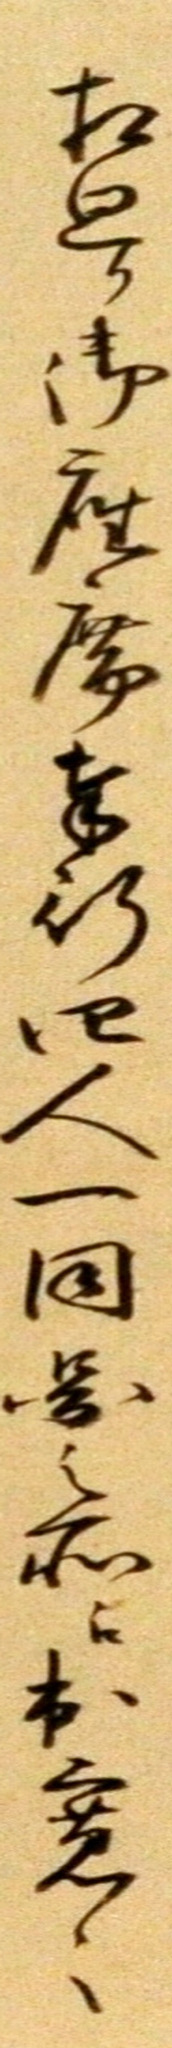相廻り、御座席奉行四人一同図之所ニ出寛之
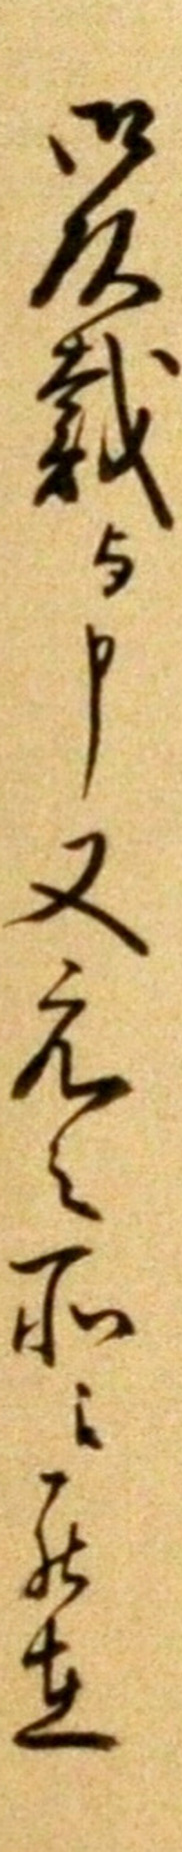御頂戴与申、又元之所ニ罷在、
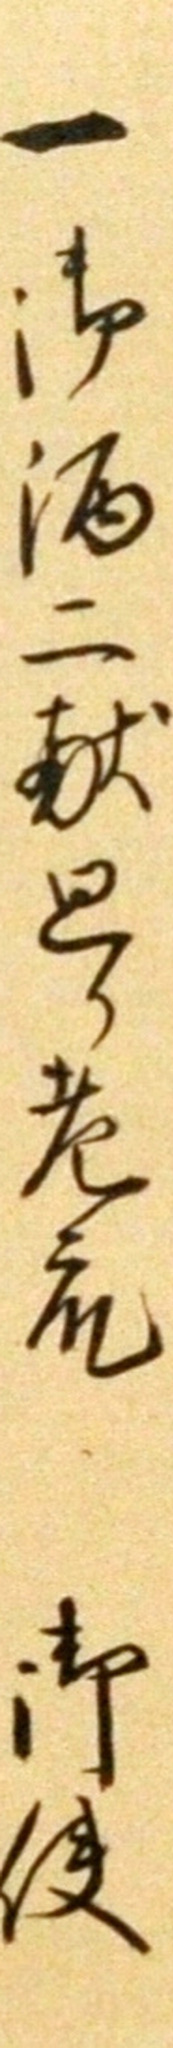一御酒二献廻り老衆御役
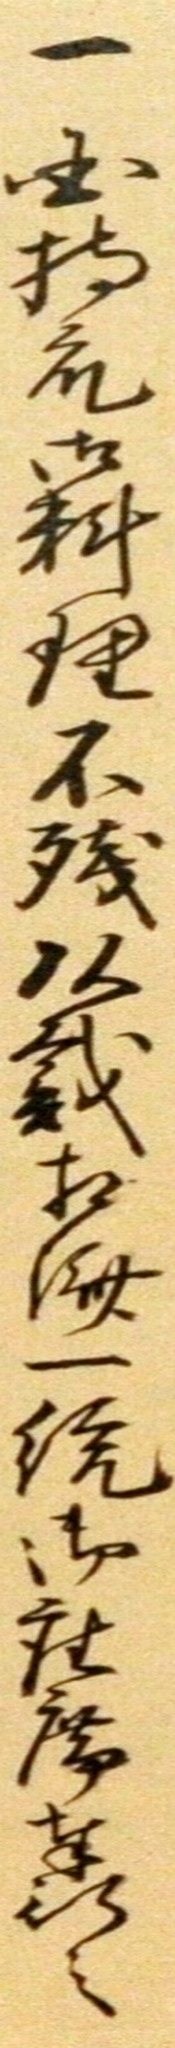一国持衆御料理不残頂戴相済、一統御座席奉行之
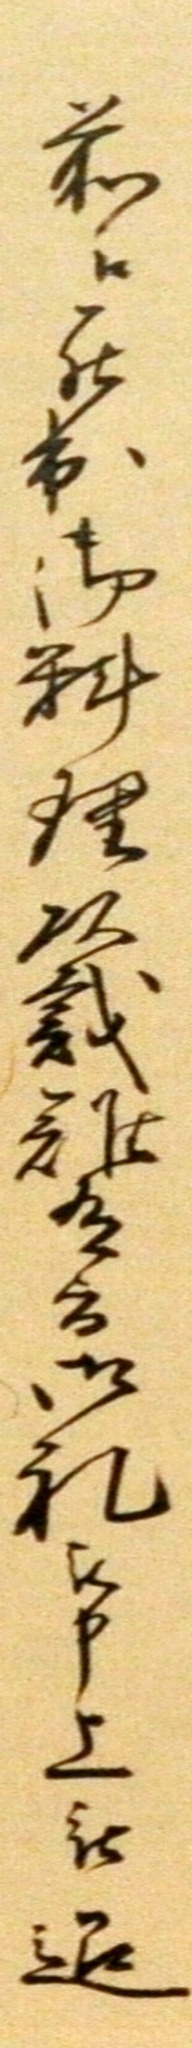前江罷出、御料理頂戴難有旨御礼被申上候、追
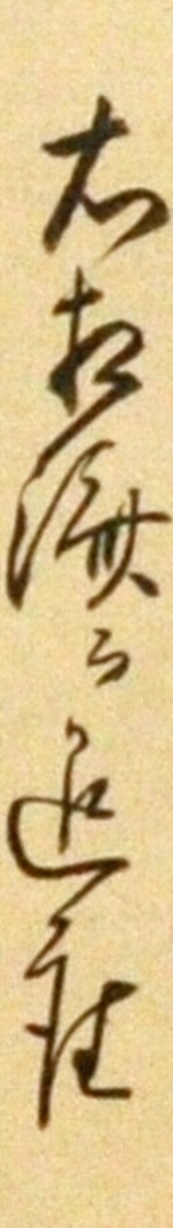右相済而退座
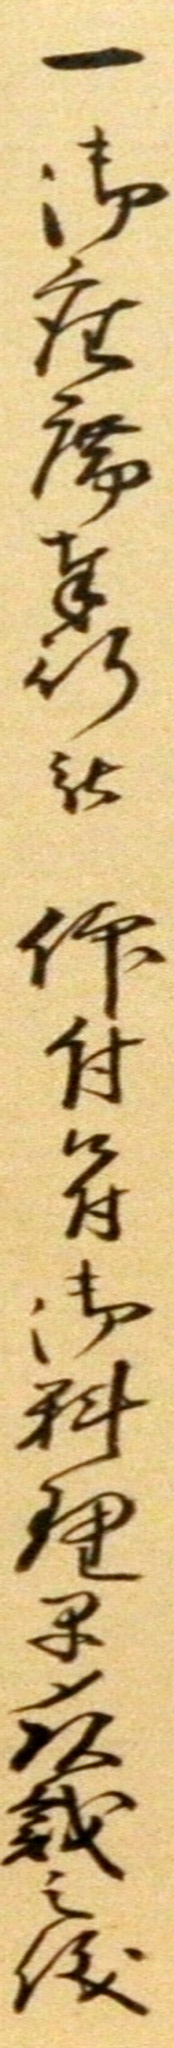一御座席奉行被仰付候付、御料理早メ頂戴之儀
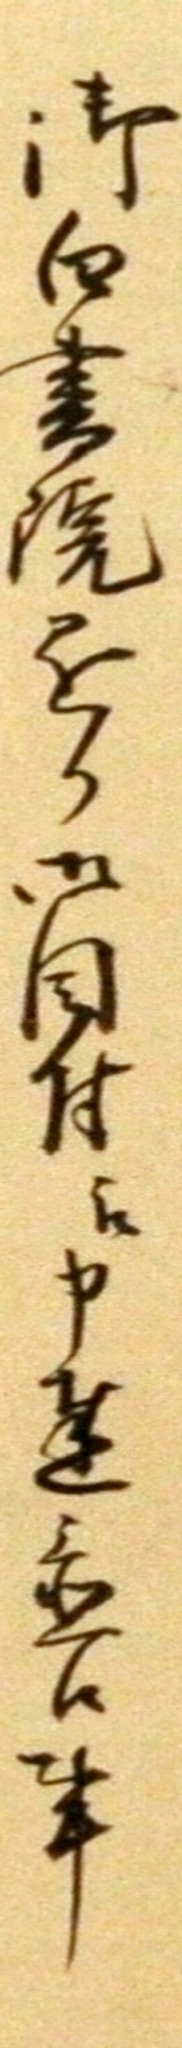御白書院懸り御目付江申達置候事
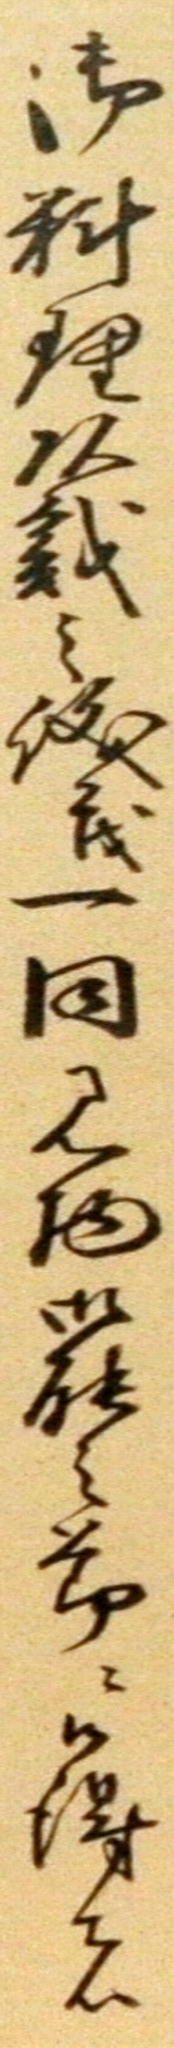御料理頂戴之儀も一同見物御能之節ニ候得者

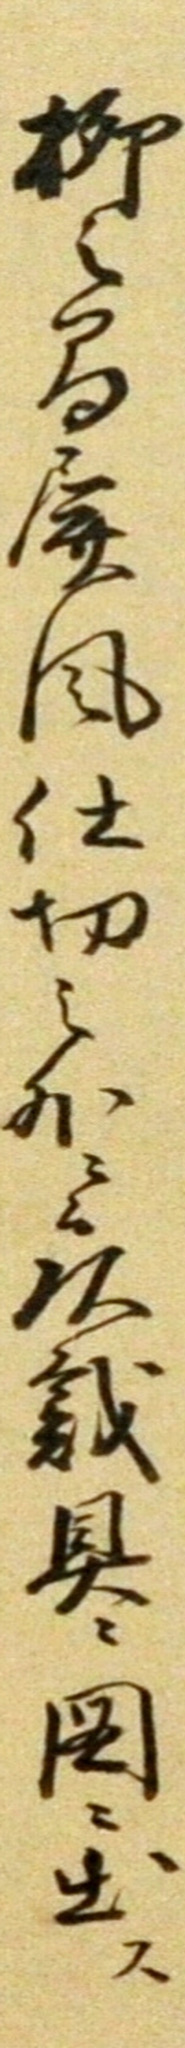栁之間屏風仕切之外ニ而頂戴具ニ図ニ出ス
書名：御白書院御座席奉行勤方留外
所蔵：伊那市立高遠町図書館・合同会社AMANE
